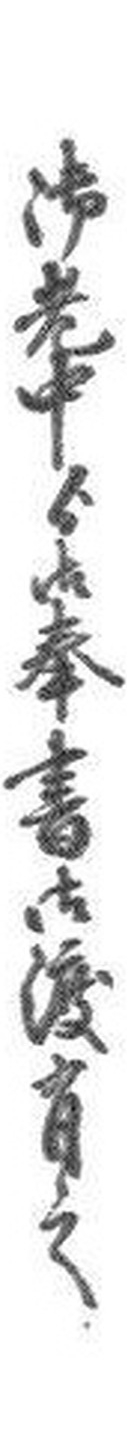御老中ゟ御奉書御渡有之
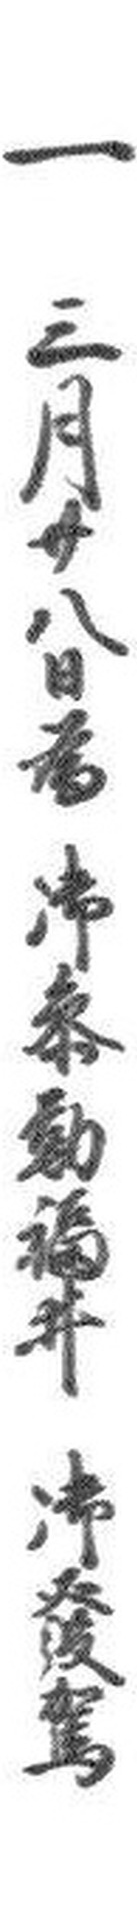一三月廿八日為御参勤福井御発駕
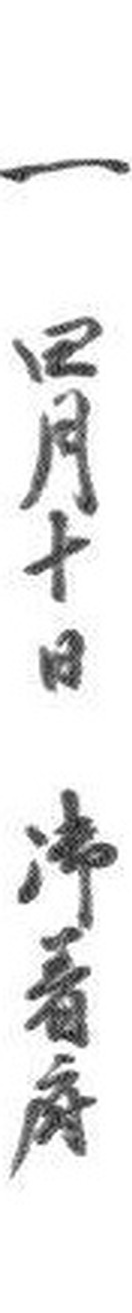一四月十日御着府
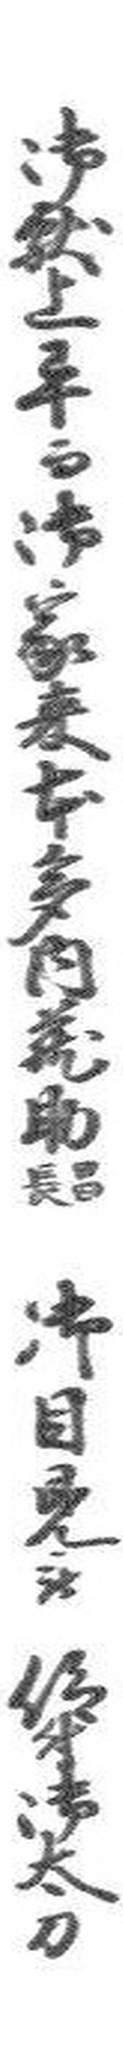御献上畢而御家来本多内蔵助長昌御目見被仰付御太刀

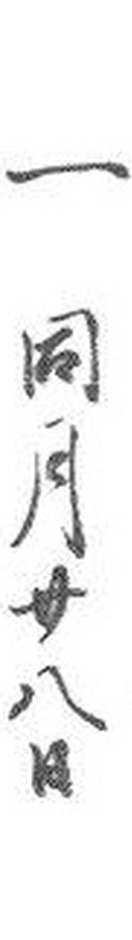一同月廿八日
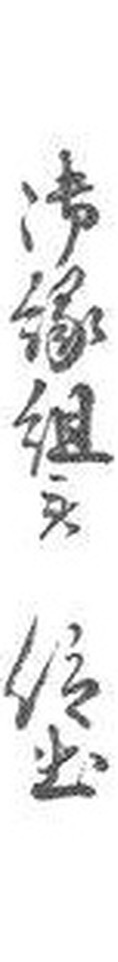御縁組被仰出
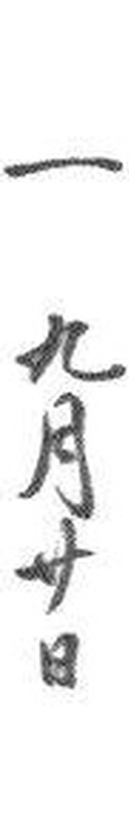一九月廿日
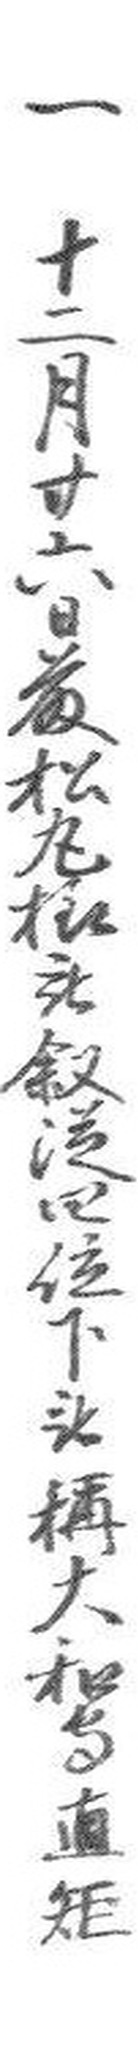一十二月廿六日藤松丸様被叙従四位下被称大和守直矩

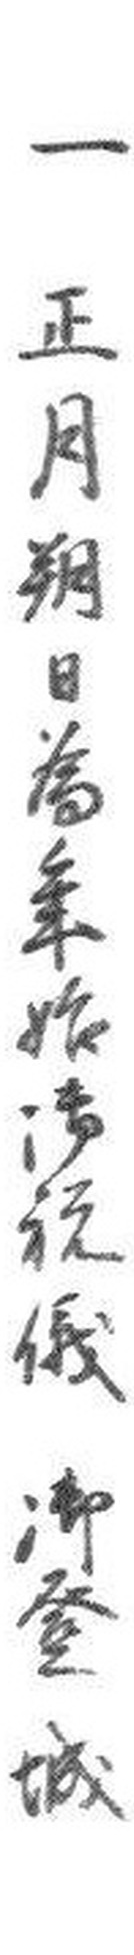正月朔日為年始御祝儀御登城
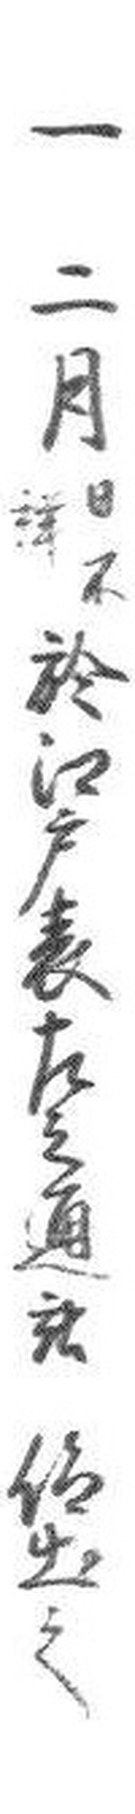一二月日不詳於江戸表左之通被仰出之
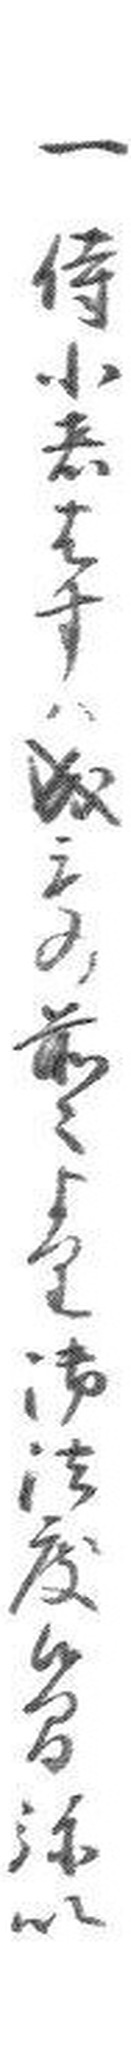一侍小者はすㇵ成もの前々より御法度候間弥以
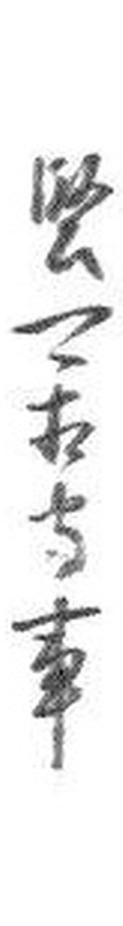堅可相守事
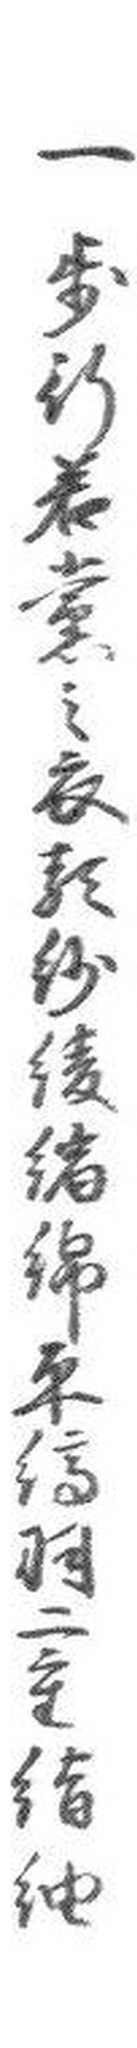一歩行若党之衣類紗綾縮綿平縞羽二重絹紬
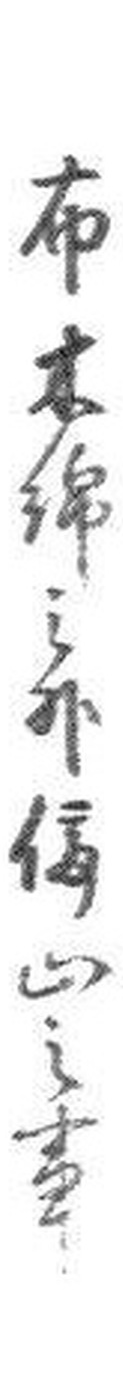布木綿之外停止之事

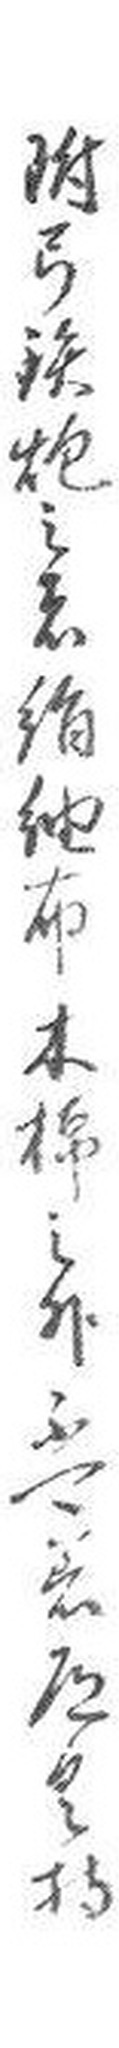附弓鉄砲之者絹紬布木綿之外不可着道具持
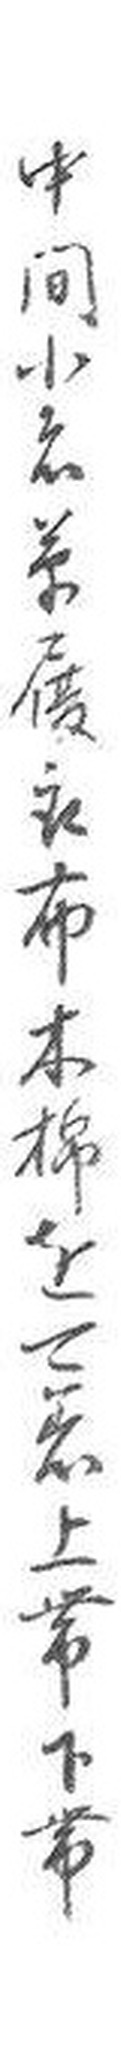中間小者草履取布木綿を可着上帯下帯
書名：家譜 五 光通公 従寛永十三年到万治二年
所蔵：福井県文書館 Fukui Prefectural Archives
